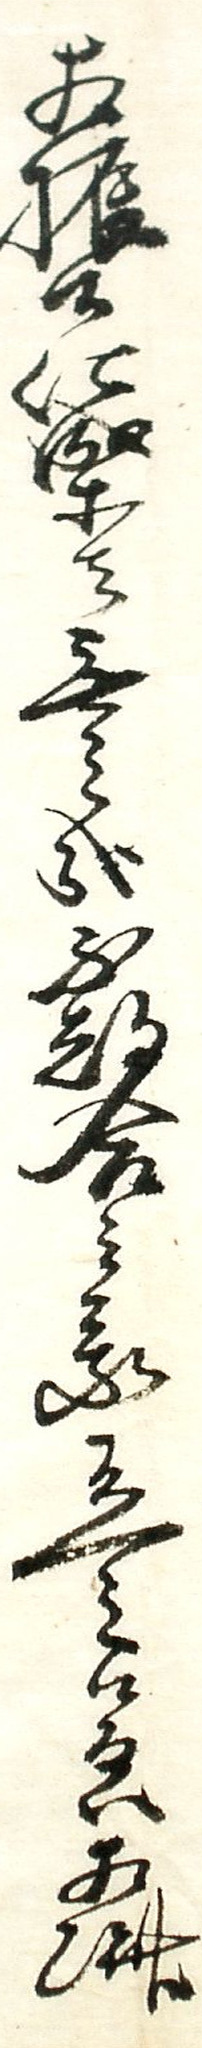相振候仕成等者無之哉不都合之義有之候而ハ相済
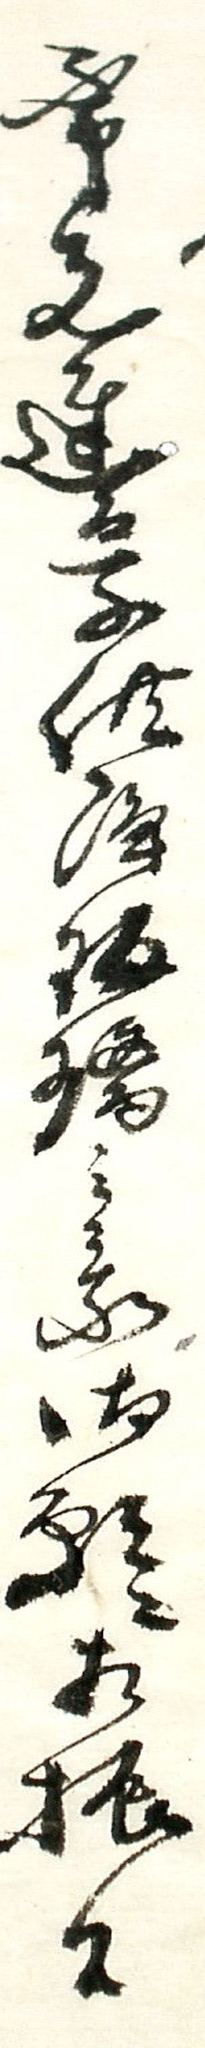不申先達而子供浄瑠璃之義御願ニ相振候
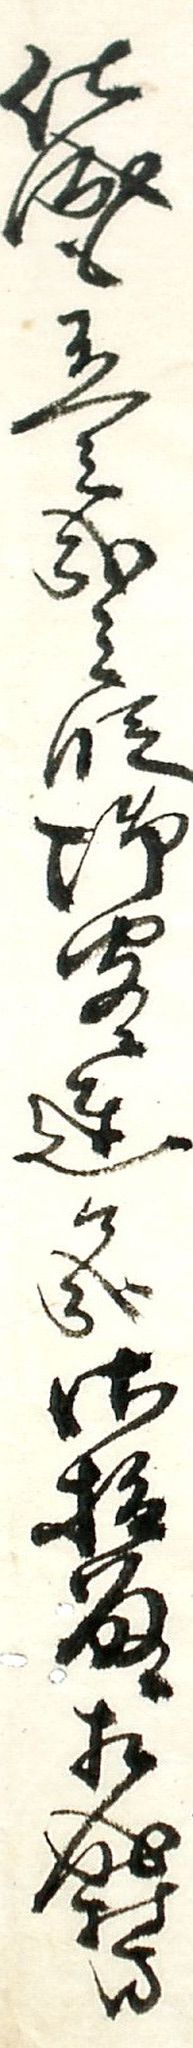仕成も有之哉之段御聞ニ達候哉御指留ニ相成村方
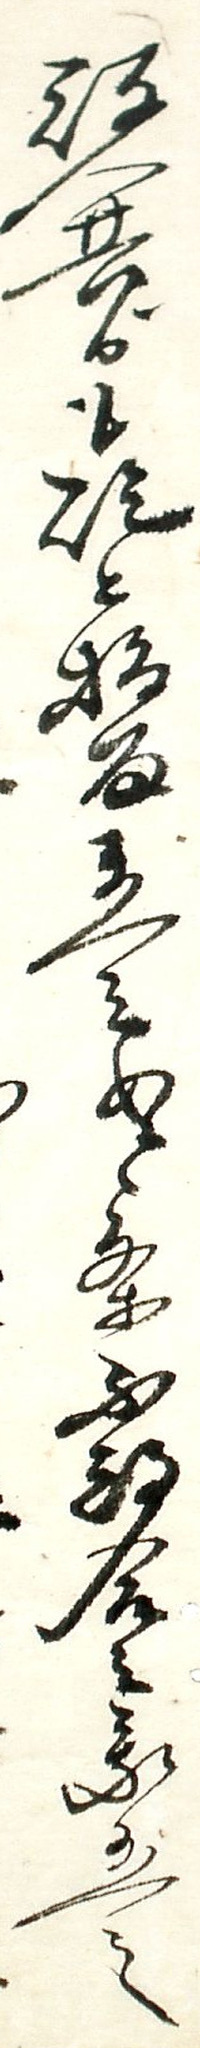役人共ゟも屹と指留有之義候条不都合之義有之
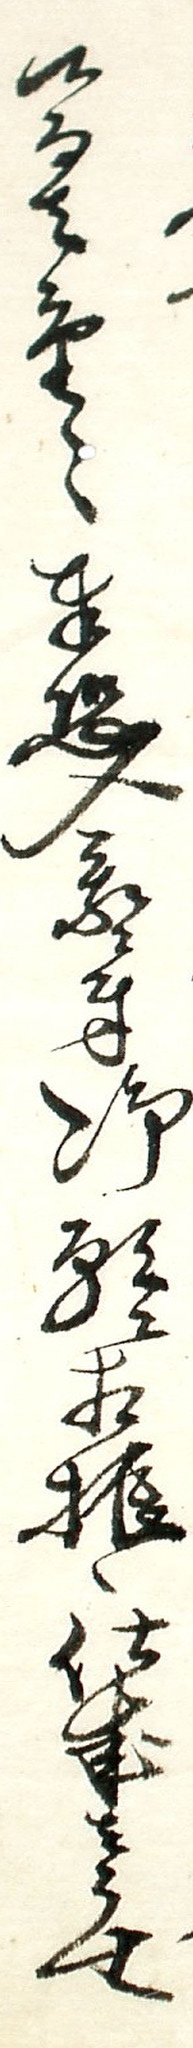候而者重々奉恐入義ニ付御願ニ相振候仕成者無
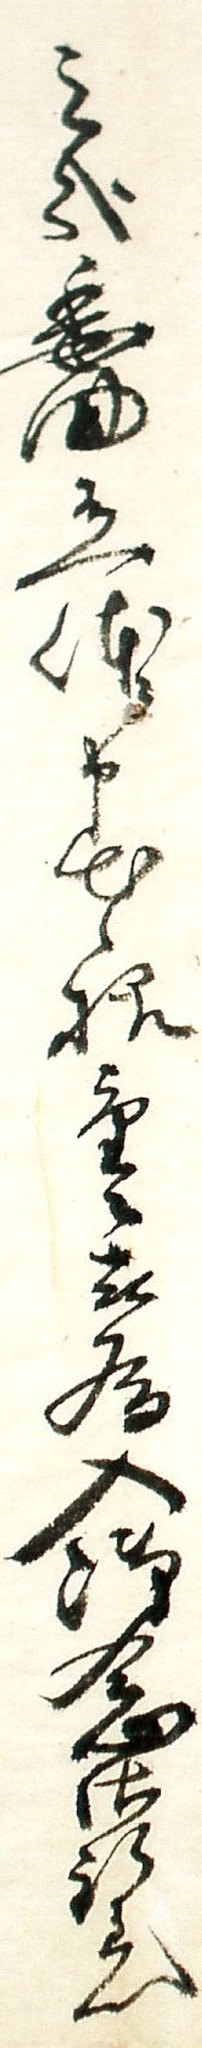之哉委曲有体ニ申出候様重々被為入御念御行着
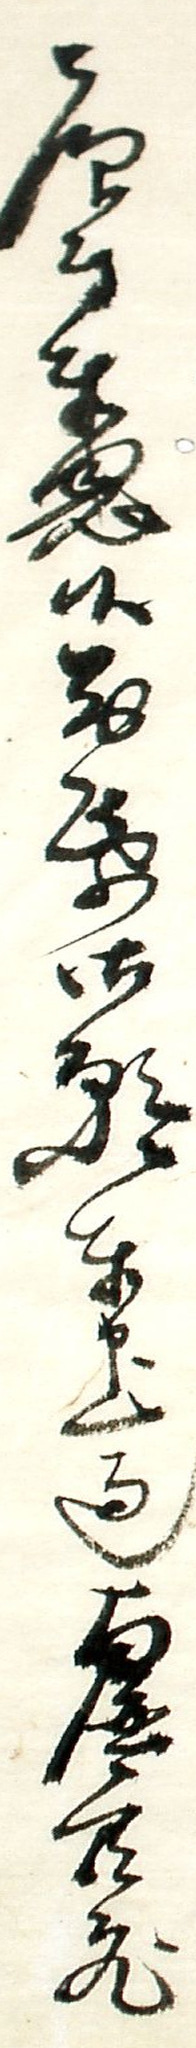被仰付奉畏候別帋御願奉申上通虚空蔵
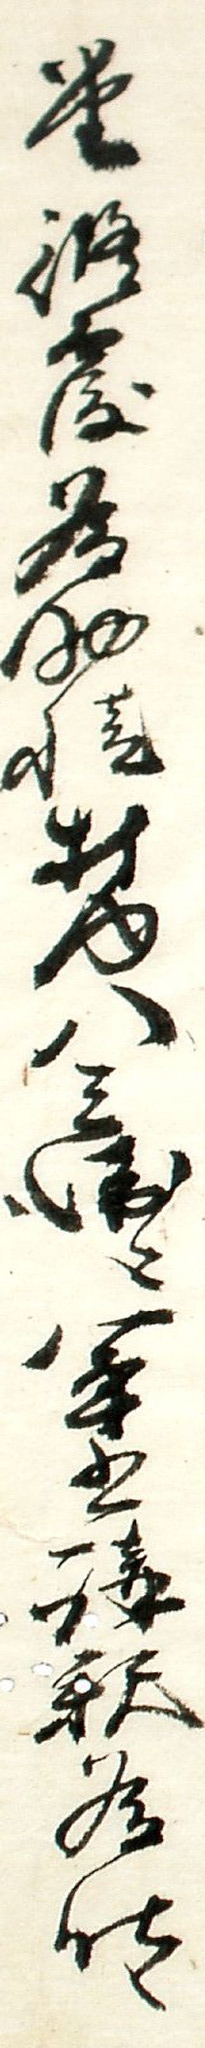堂修覆為助情村内八兵衛ニ軍書講釈為仕候
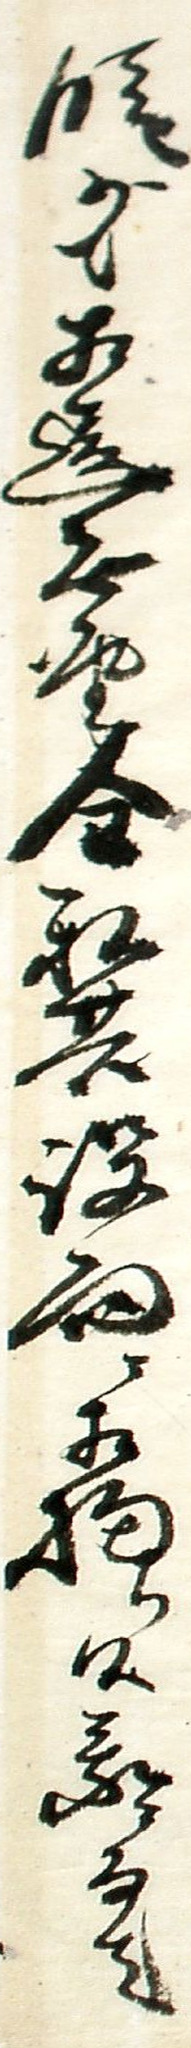段少も相違無御坐全私共役向ニ相拘り候義ニ而者
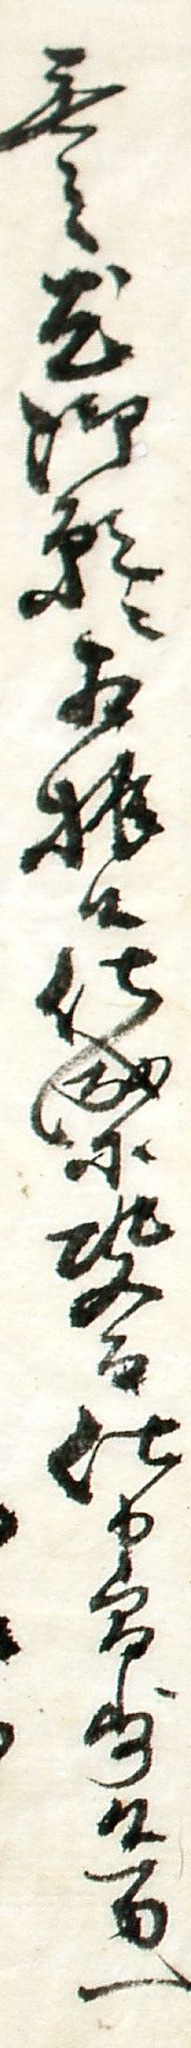無之尤御願ニ相振候仕成等決而仕申間布候万一
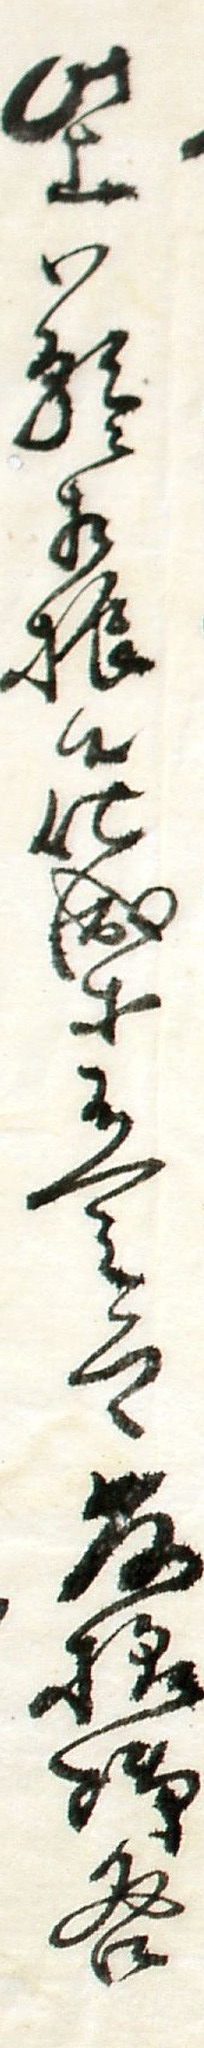此上御願ニ相振候仕成等有之候ハヽ如何様御咎
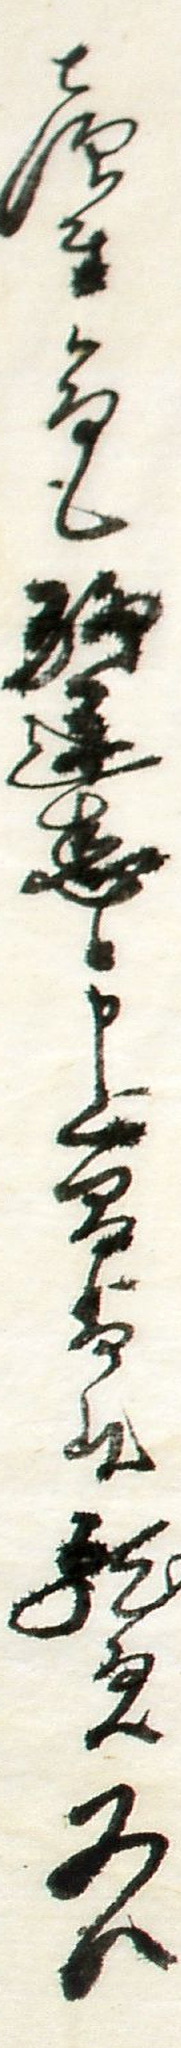被仰付候而も聊迷惑と申上間布候就而ハ右
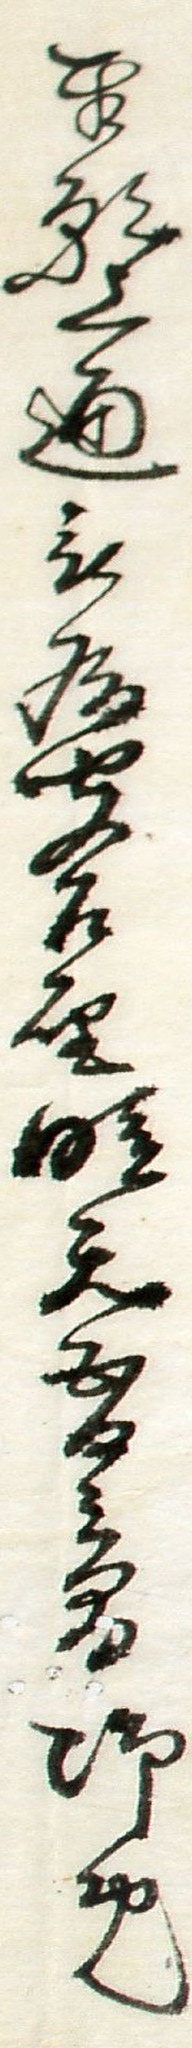奉願上通被為聞召届晴天五日之間御免
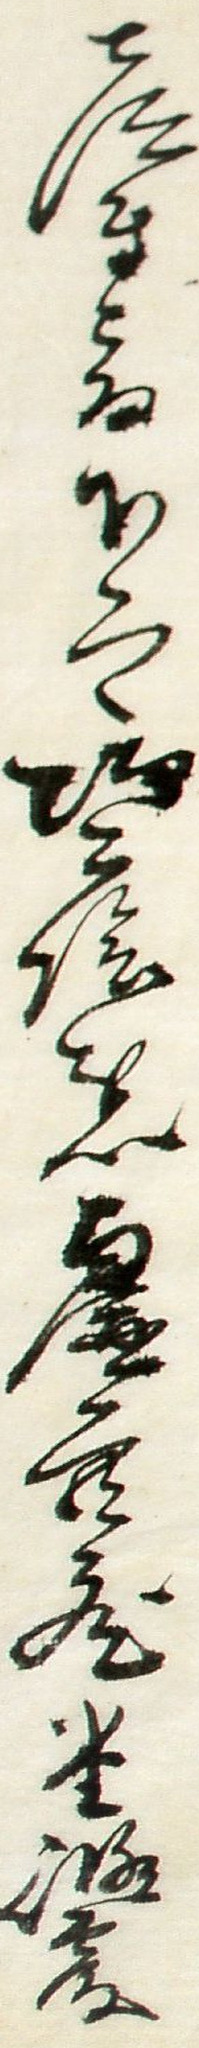被仰付被為下候ハヽ御蔭を以虚空蔵堂修覆

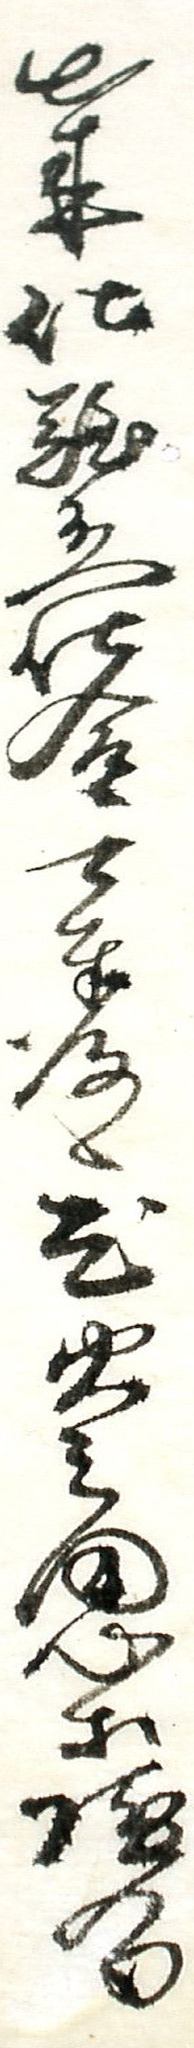出来仕難有仕合可奉存候尤火之用心等随分
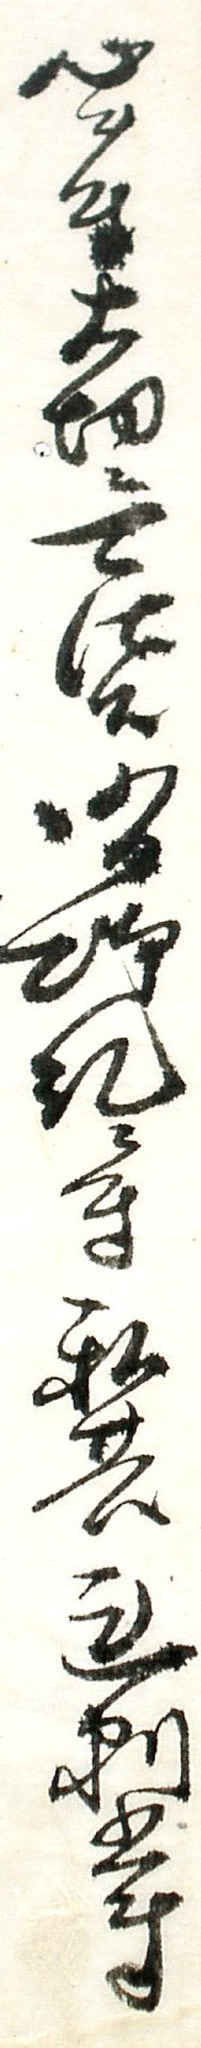心ヲ付大切ニ可仕候仍而御糺ニ付私共連判書付
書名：(早渕村福満寺子ども浄瑠璃願紙面）他
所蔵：鳴門教育大学 Naruto University of Education
